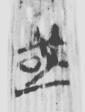或
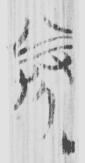倦
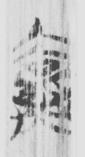暴
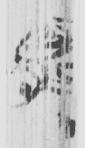{𣎆角}
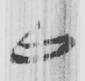㠯（以）
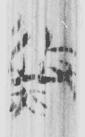{魚攴}
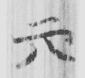亓
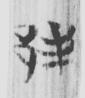邦
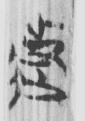﨤
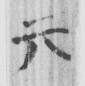亓
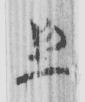{爪土}
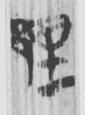{里邑}
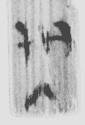{卅六}
